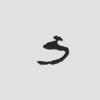乃
